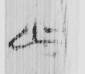少
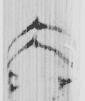大
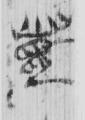{鼠一}
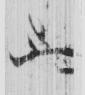之
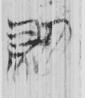則
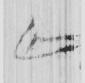亡
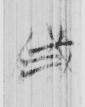{戈二}
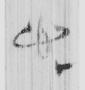心
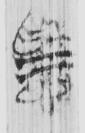{爲心}
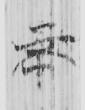不
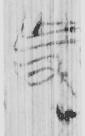拃
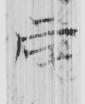厇
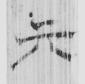亓
